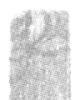邙
